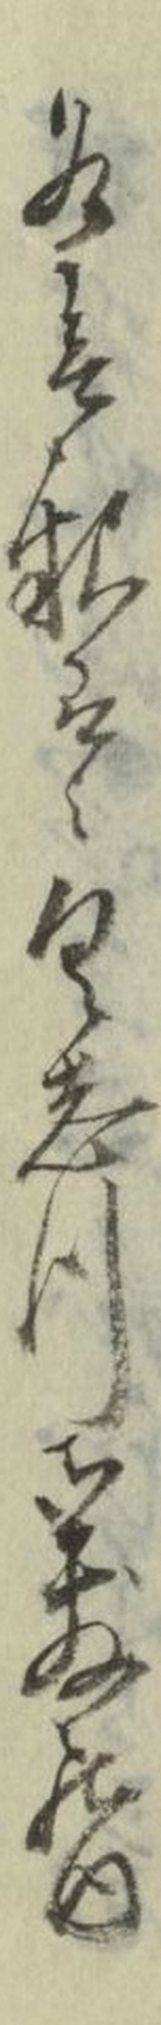各会釈有之具志川御敷居内
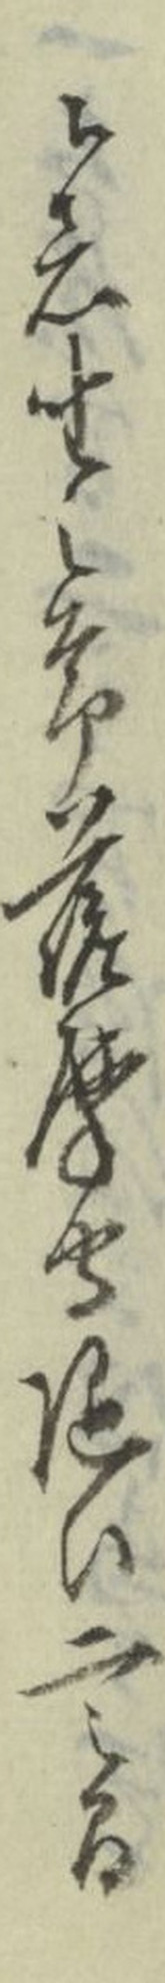え出坐之節薩摩守随ひ二之間
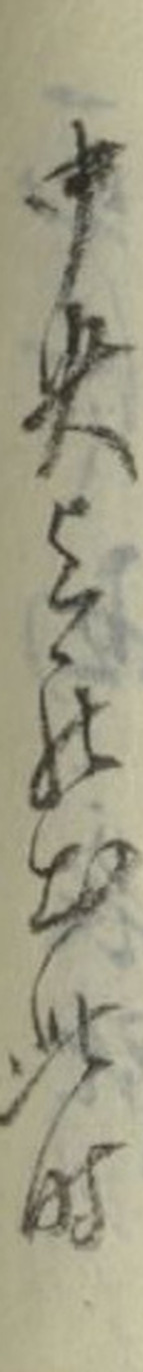中央迄被罷出此時
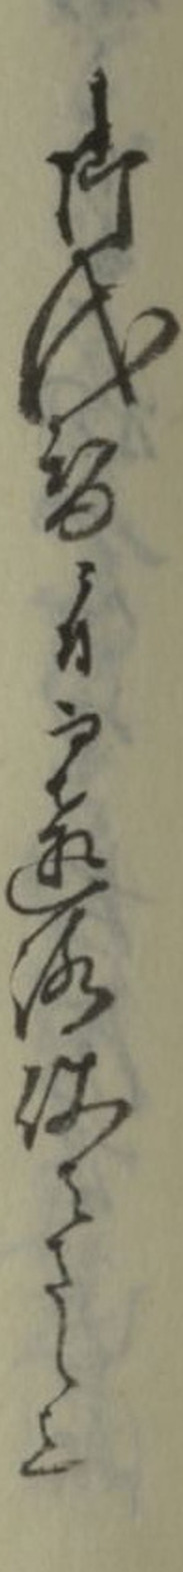御代替に付而遠路使者さし上
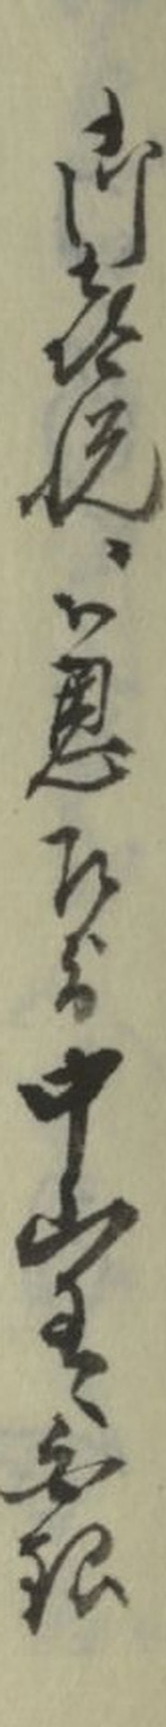御喜悦に被思召候旨中山王へ白銀
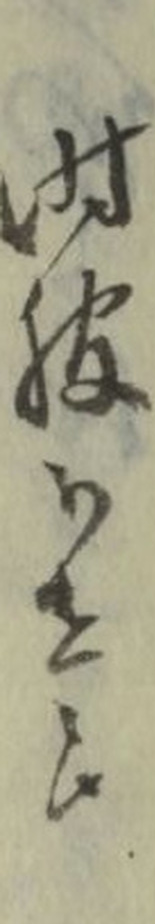時服被遣候
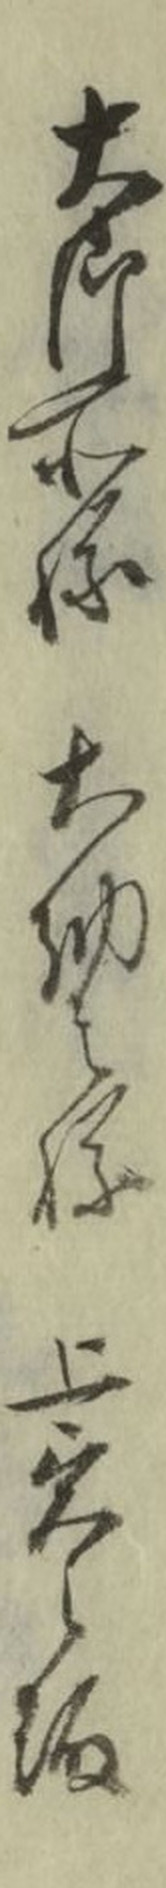大御所様大納言様上意之趣
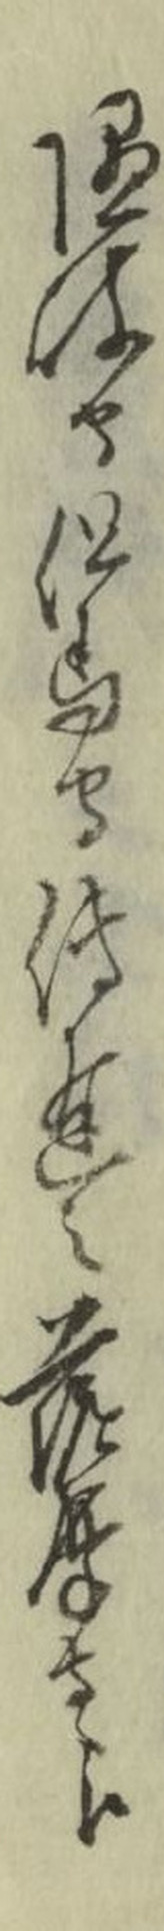隠岐守但馬守伝達之薩摩守え
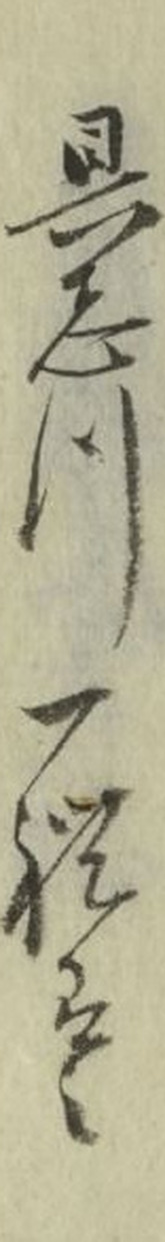具志川一礼有之

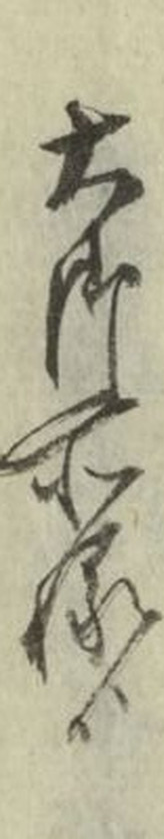大御所様ゟ
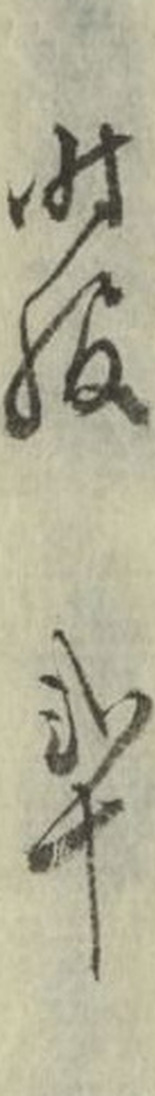時服弐十
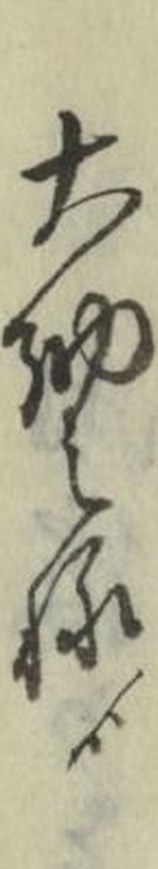大納言様ゟ
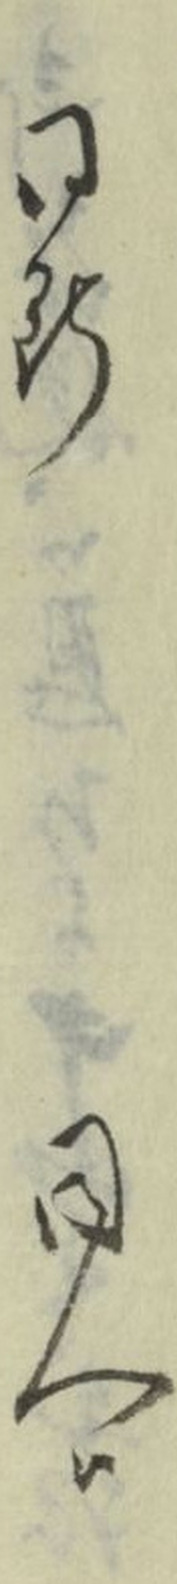同断同人え
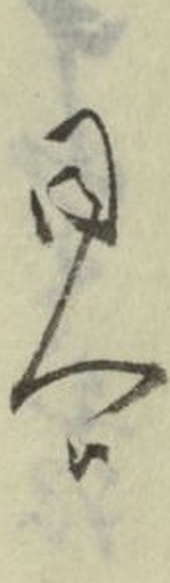同断同人え
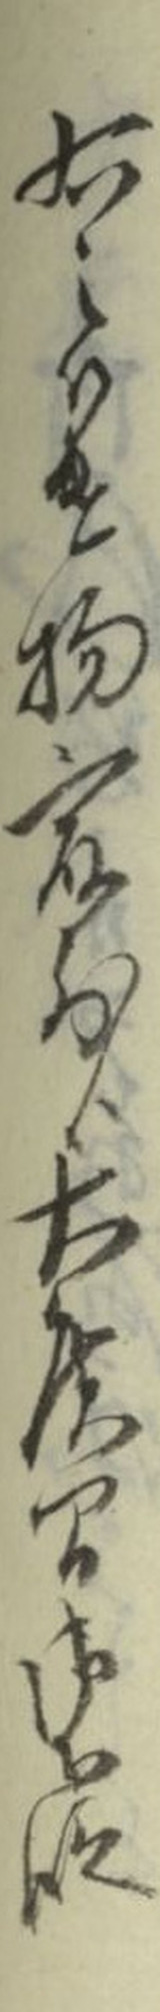右之被遣物君前ゟ大広間御下段
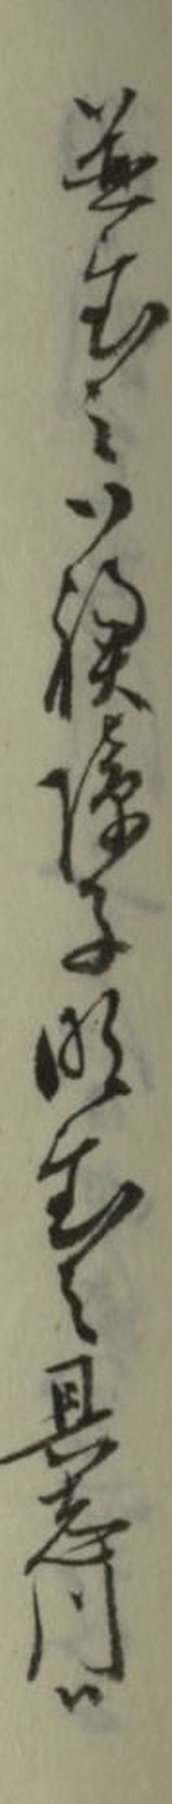並置之御襖障子明置之具志川え
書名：琉球人来朝記 四之五
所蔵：University of the Ryukyus Library
